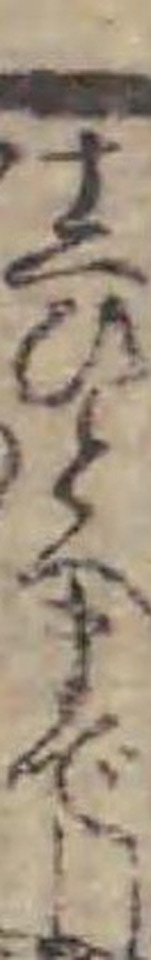十二ひとへまで
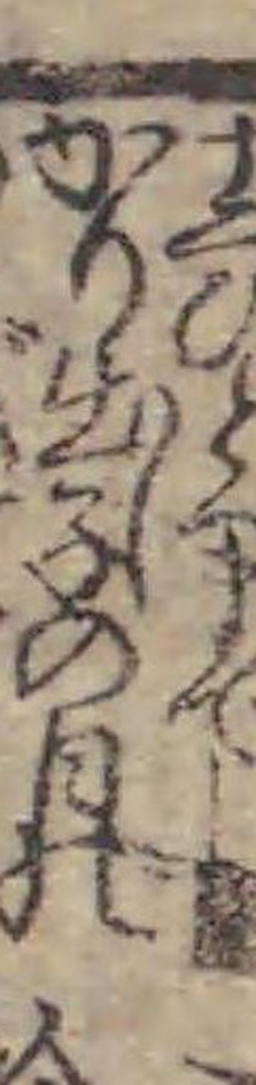かり出し子の日の
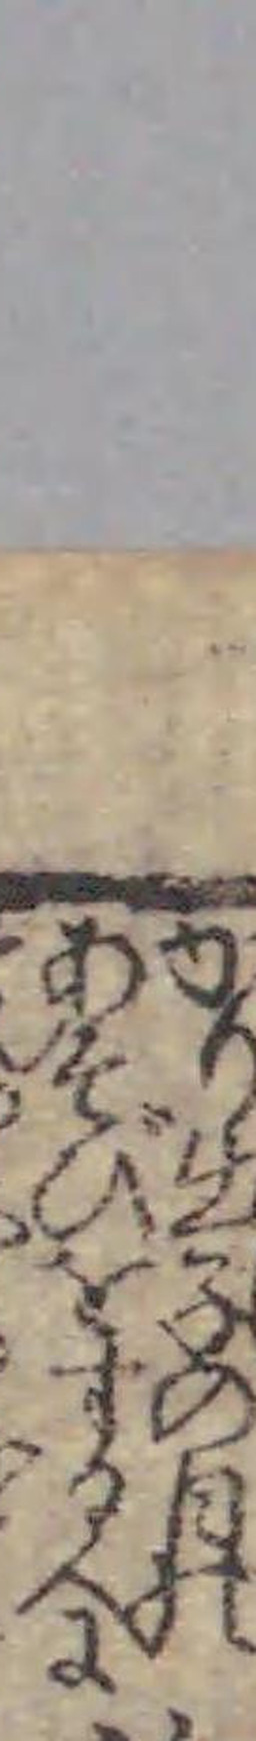あそびをする人に
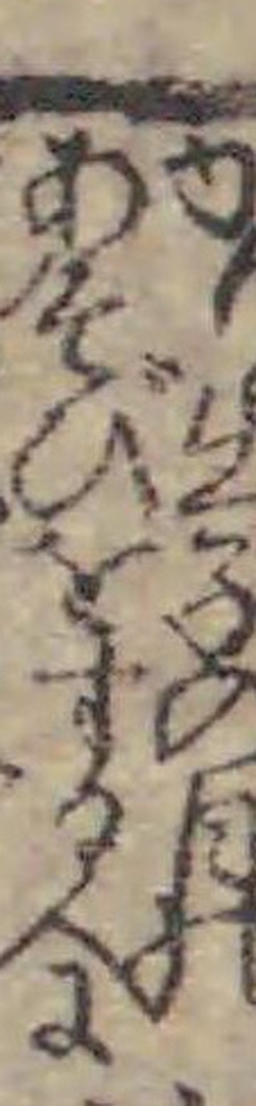あそびをする人に
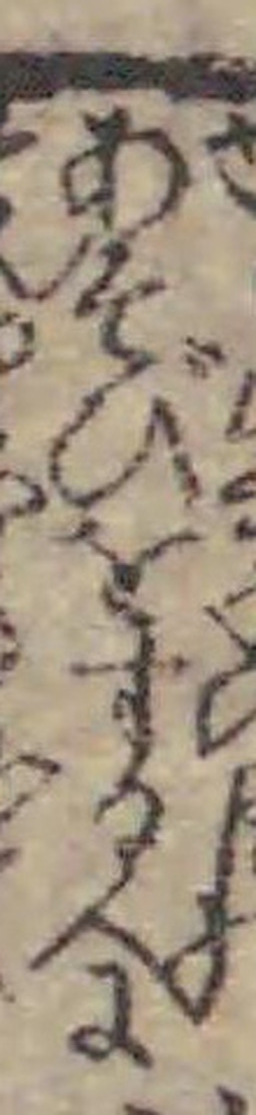あそびをする人に
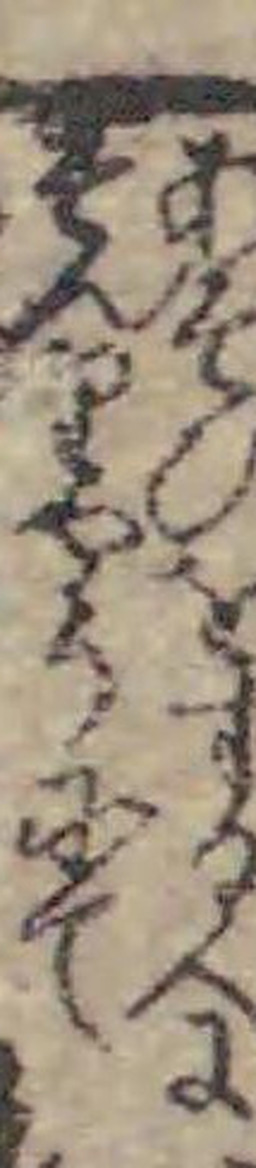そんりやうにて
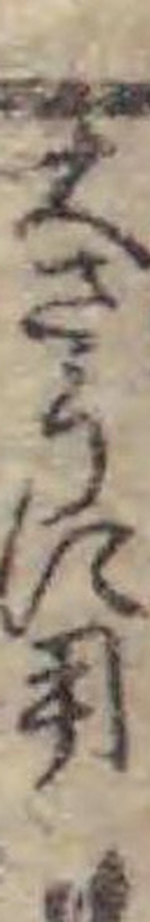大さうに用
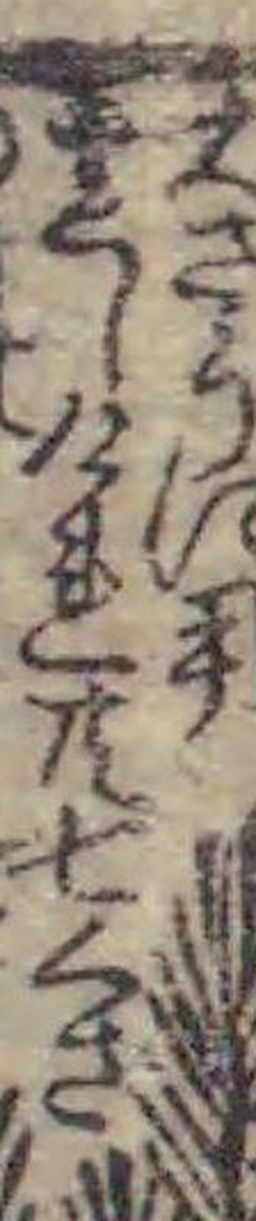意しけれ共七くさ
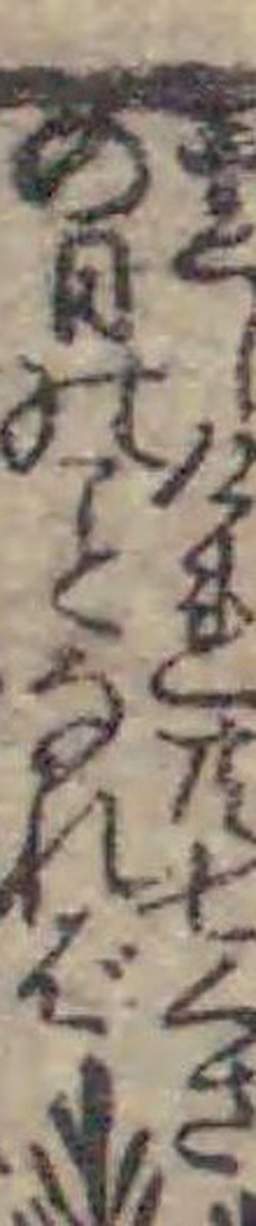の日のことなれば
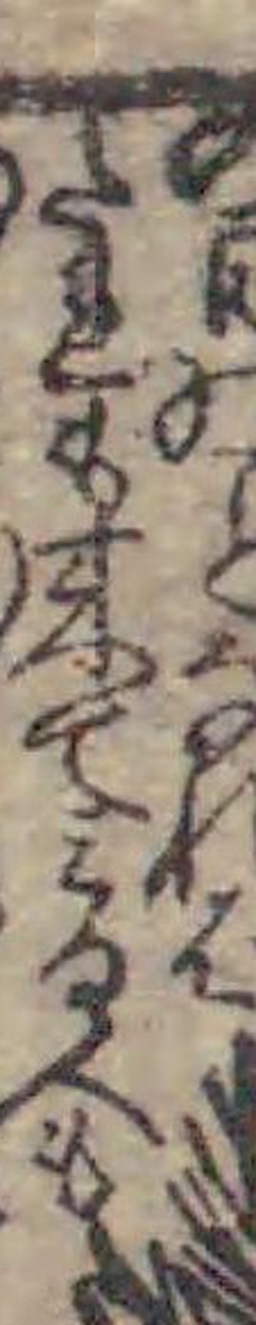たれも来てみる人も
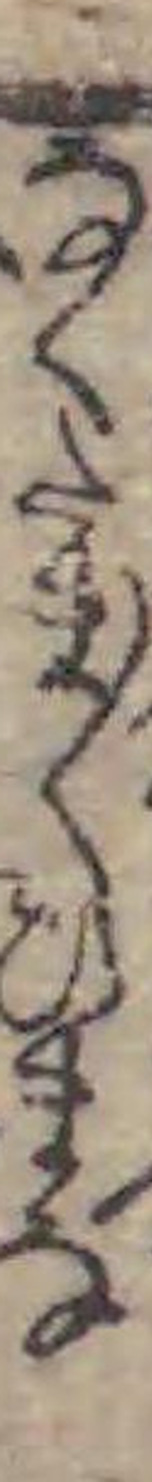なくたま〳〵ひまな
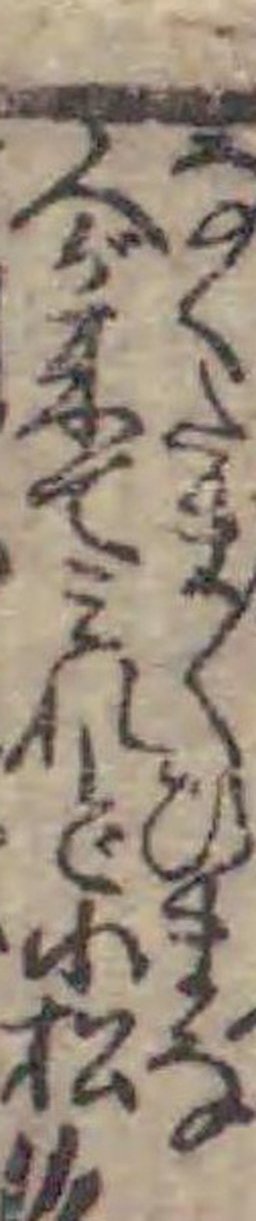人が来てみれど小松
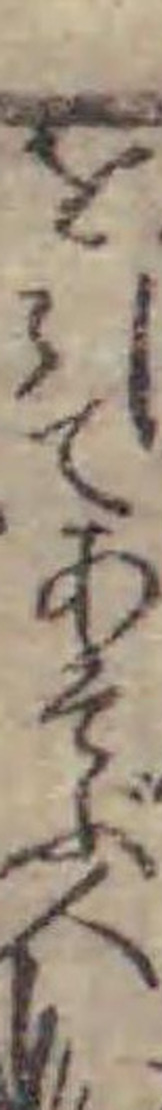を引てあそぶ人
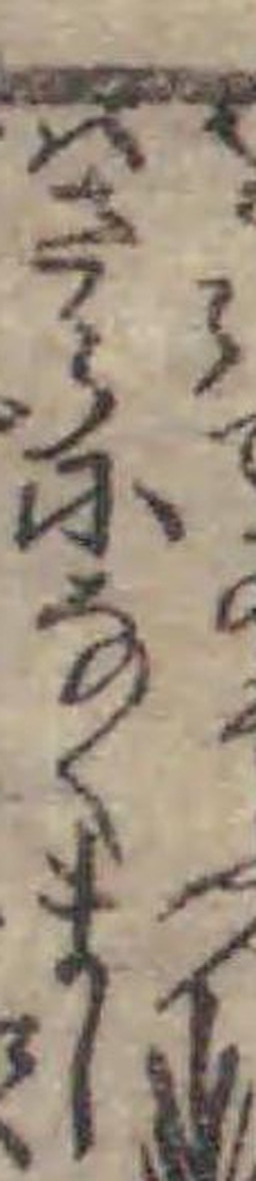はさらになくまして
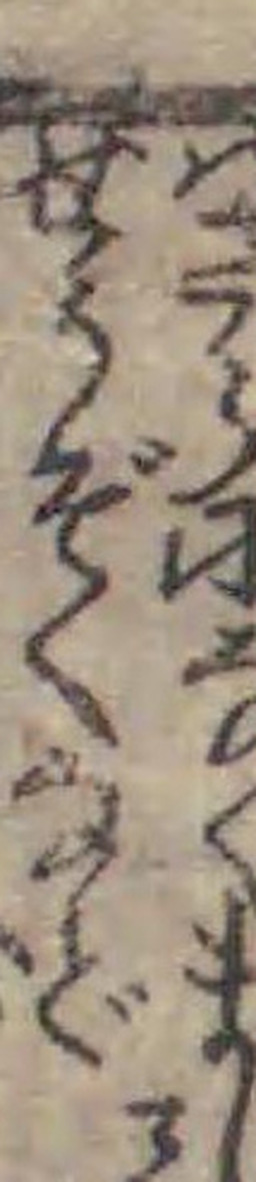せうぞくなど
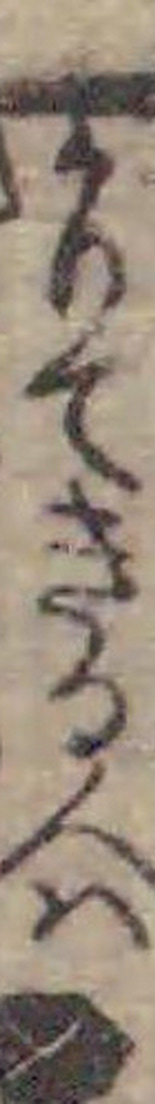かりてきる人は
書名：本樹真猿浮気噺 : 3巻
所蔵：国立国会図書館 National Diet Library, JAPAN
